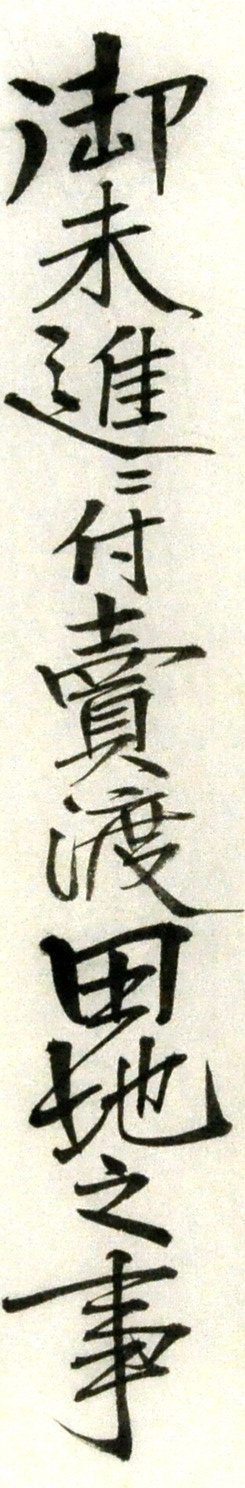御未進ニ付売渡田地之事
